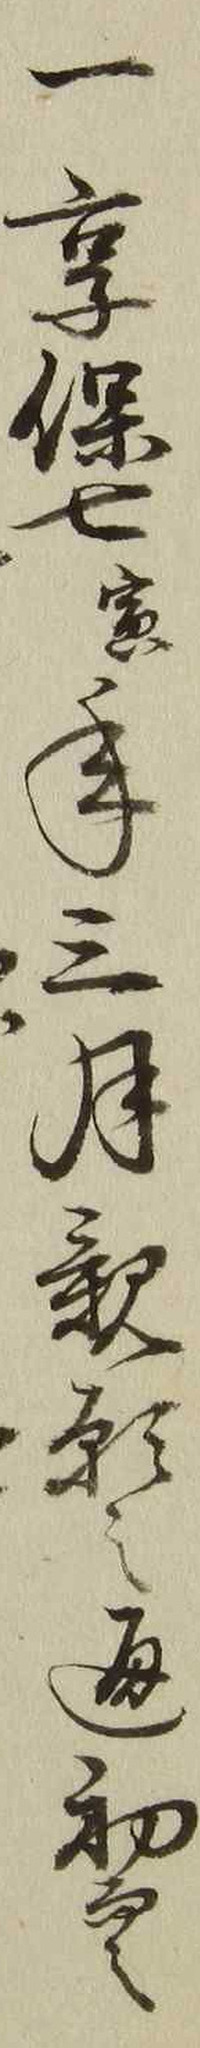一享保七寅年三月親願之通初而之
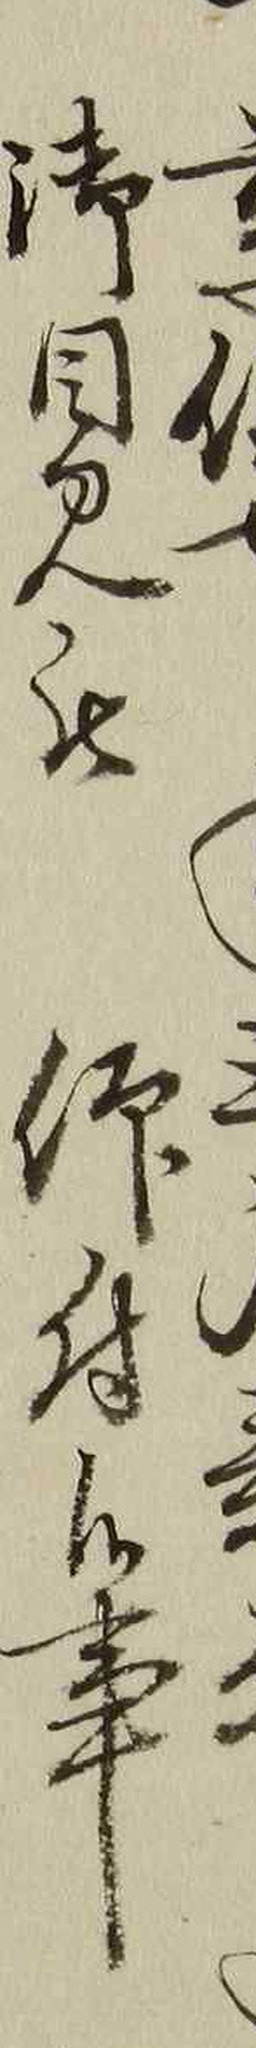御目見被仰付候事
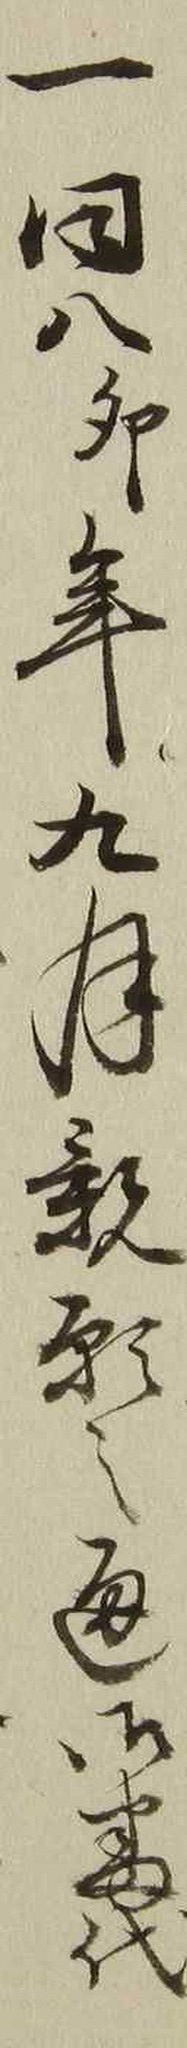一同八卯年九月親願之通御番代
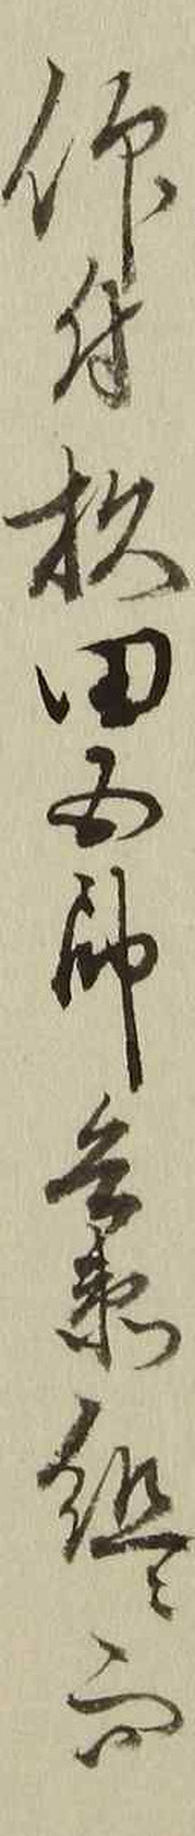被仰付杉田五郎兵衛組ニ而
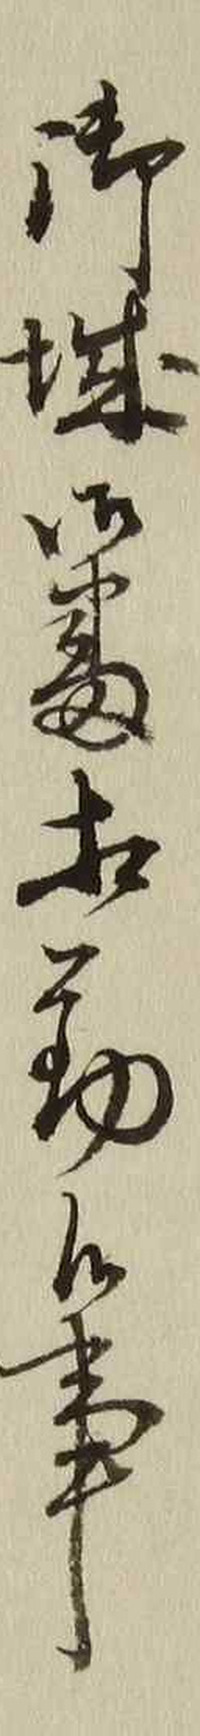御城御番相勤候事
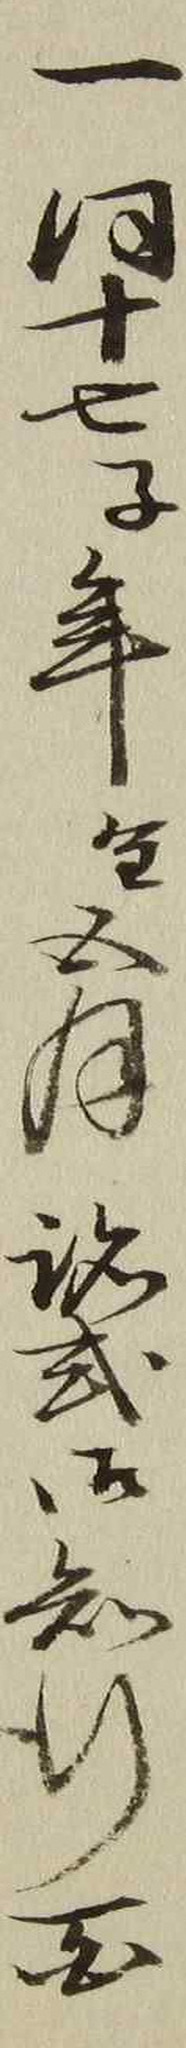一同十七子年閏五月跡式御知行百
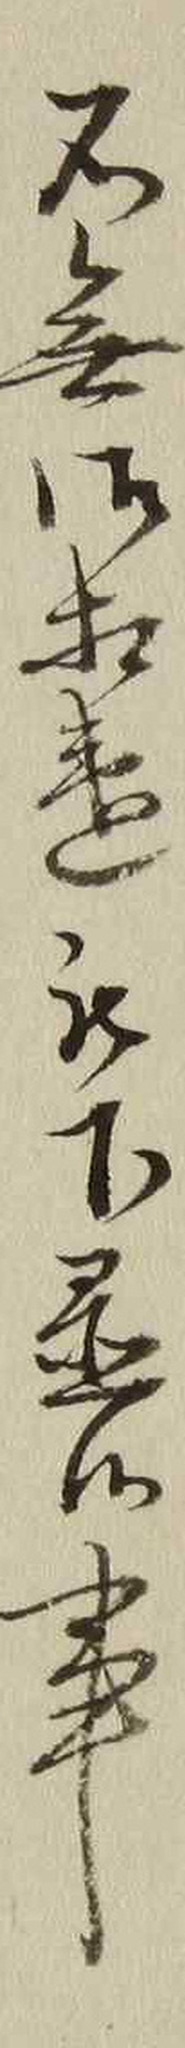石無御相違被下置候事
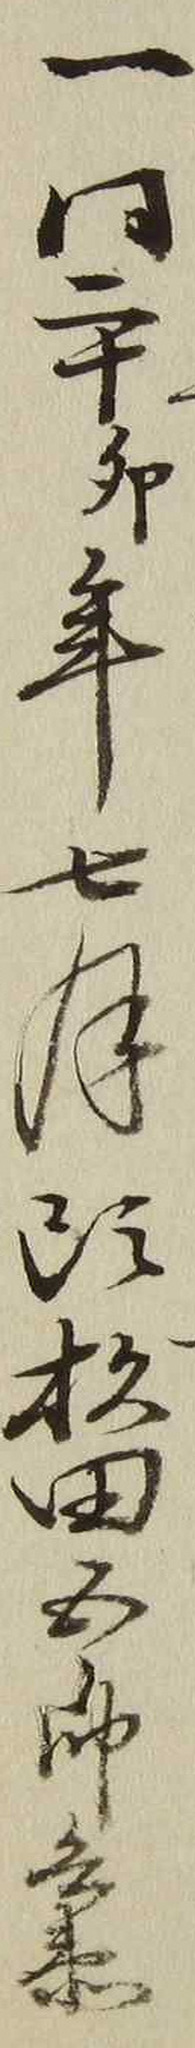一同二十卯年七月頭杉田五郎兵衛
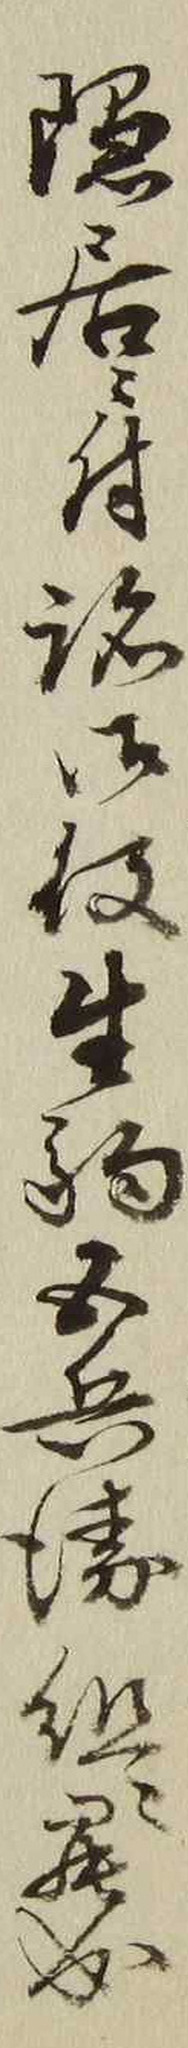隠居ニ付跡御役生駒五兵衛組ニ罷成
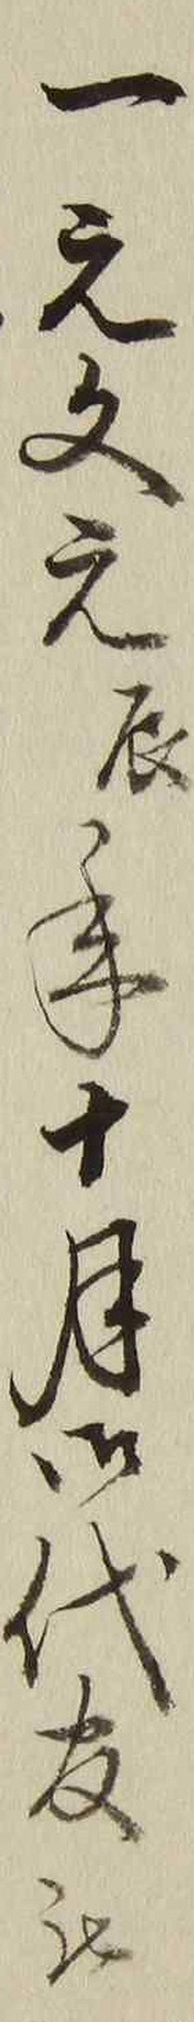一元文元辰年十月御代官被
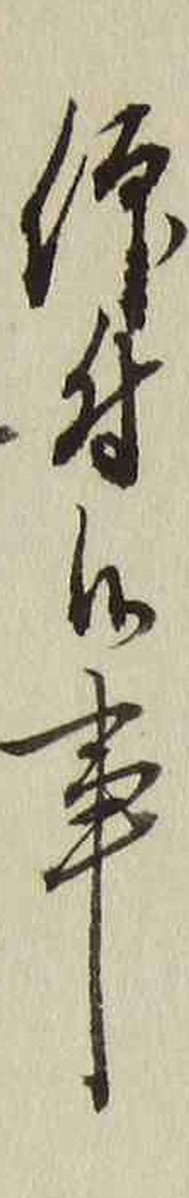仰付候事
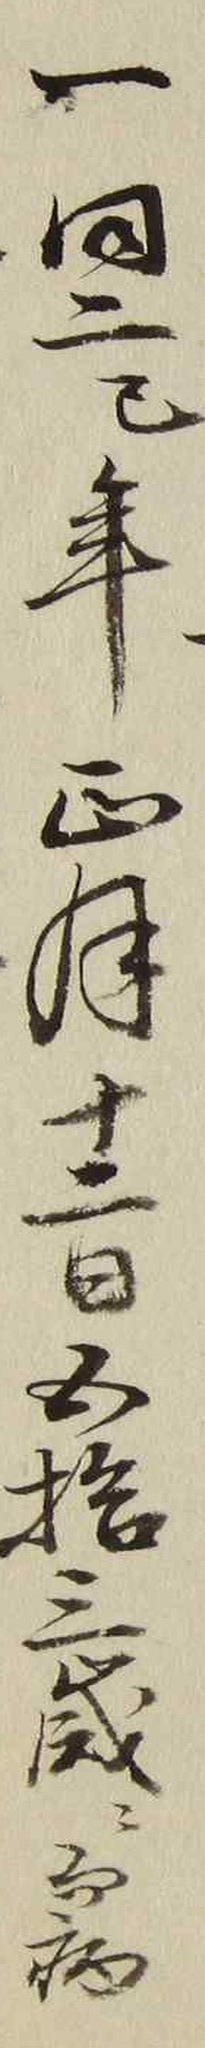一同二巳年正月十二日五拾三歳ニ而病
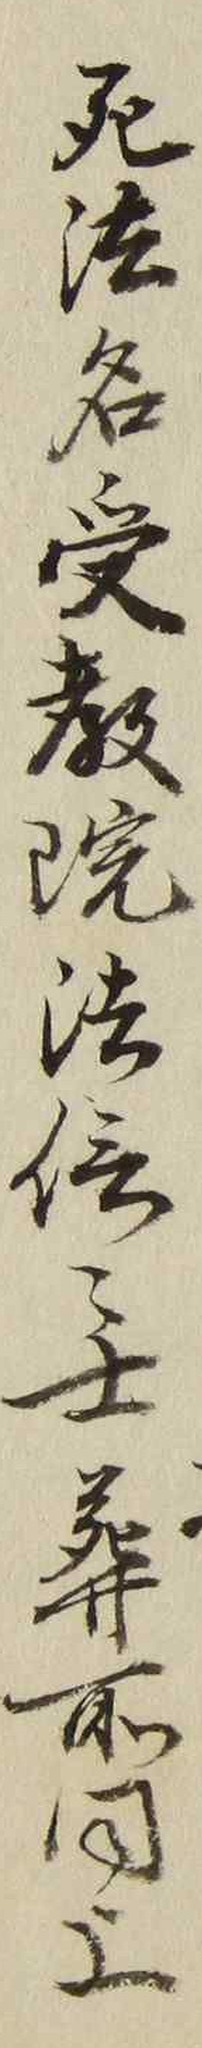死法名受教院法信々士葬所同上

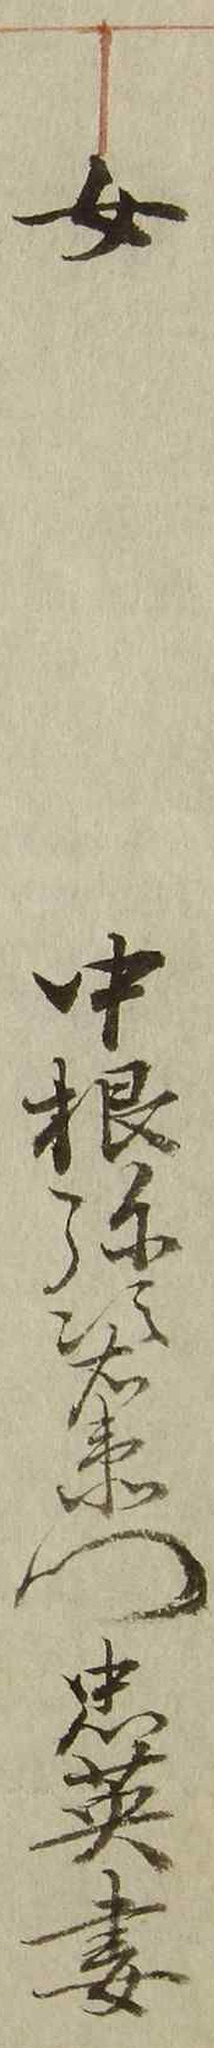女中根弥次右衛門忠英妻
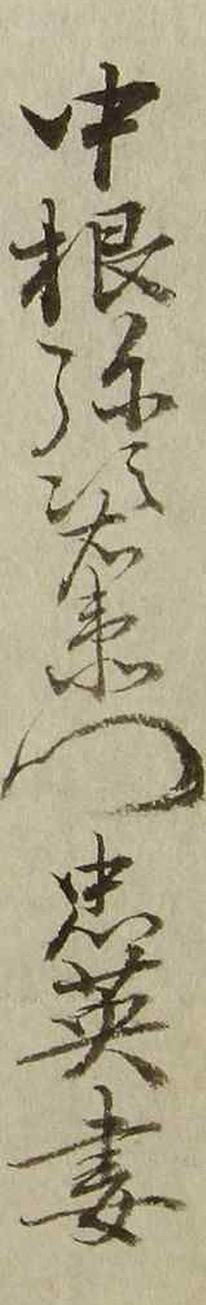女中根弥次右衛門忠英妻
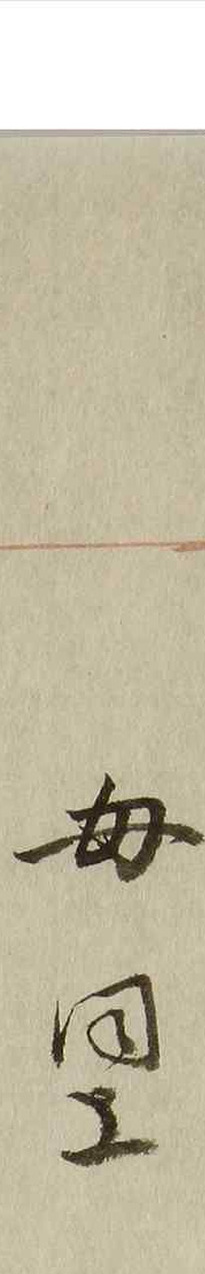母同上
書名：諸士系譜　巻之36　は之部4
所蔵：会津若松市立会津図書館
